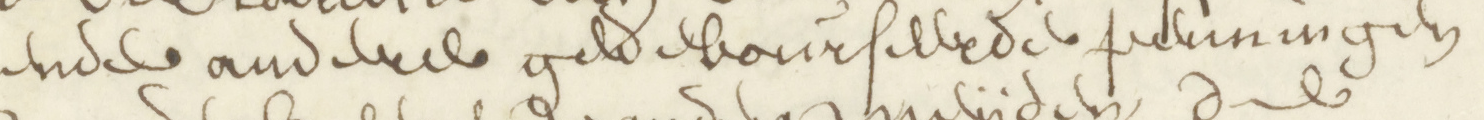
ende andere gedebourseerde penningen
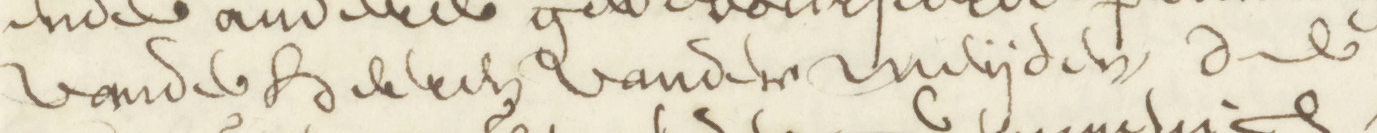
vande Heeren vander Meijden, de
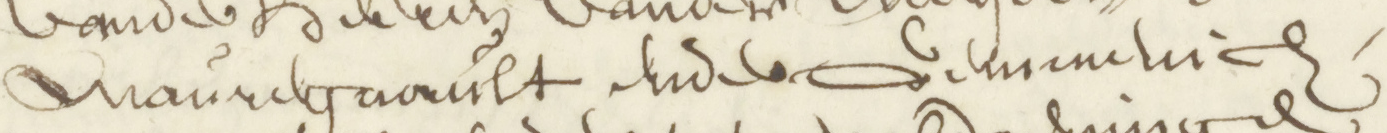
Mauregnault ende Gemmenich,
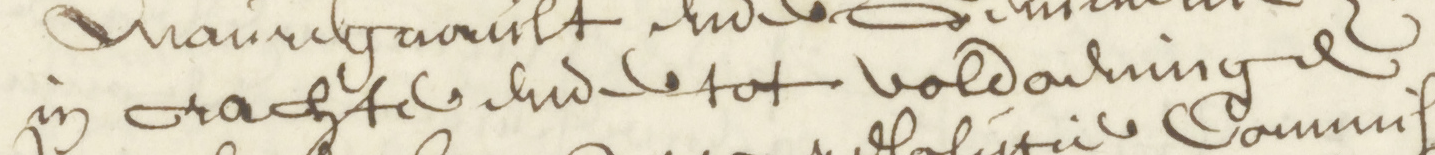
in crachte ende tot voldoeninge
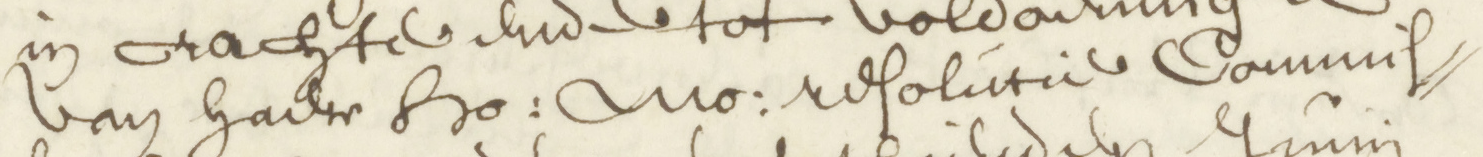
van haer Ho:Mo: resolutie Commis„
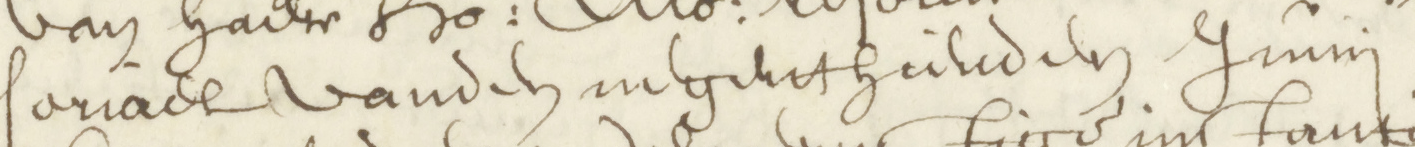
soriael vanden negenthienden Junij
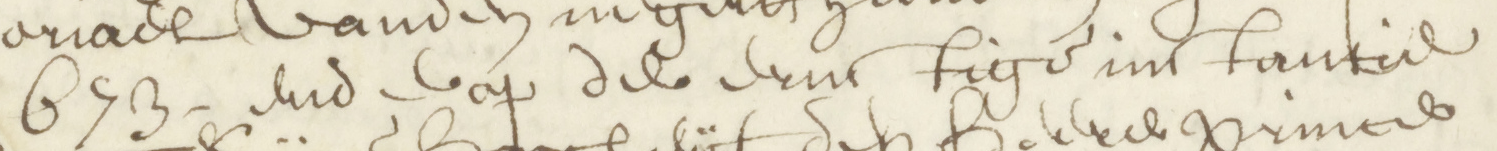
1673. ende op de ernstige instantie
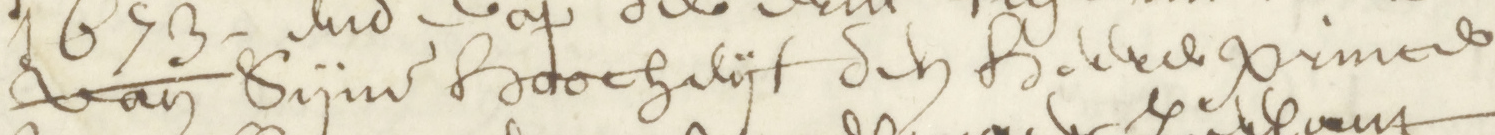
van Sijne Hoocheijt den Heere Prince
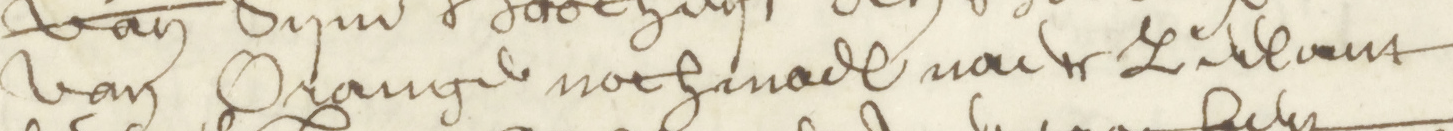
van Orange nochmael naer Zeelant
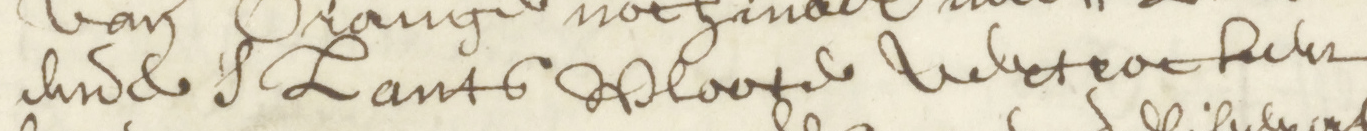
ende Lants Vloote vertrocken
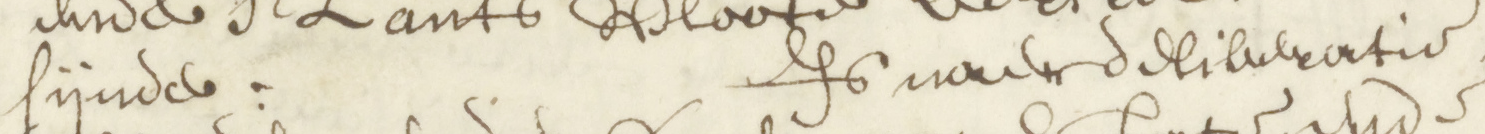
sijnde: Is naer deliberatie
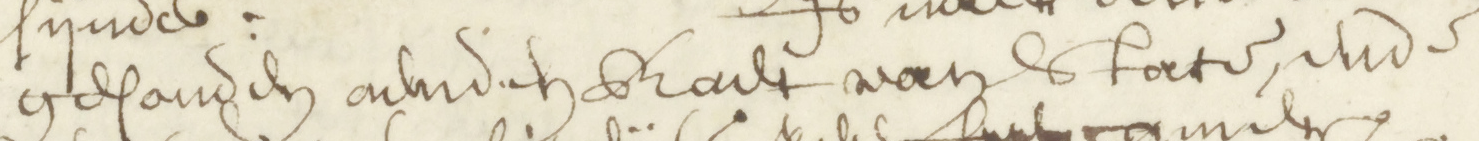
gesonden aenden Raet van State, ende
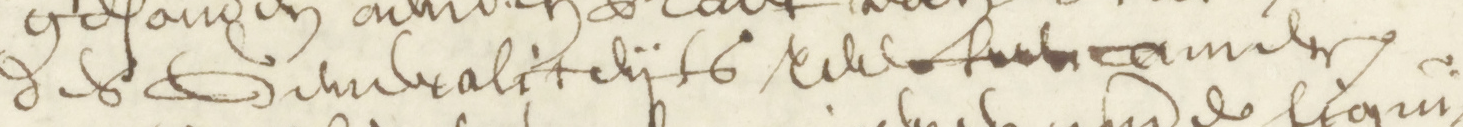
des Generaliteijts reeckencamer,
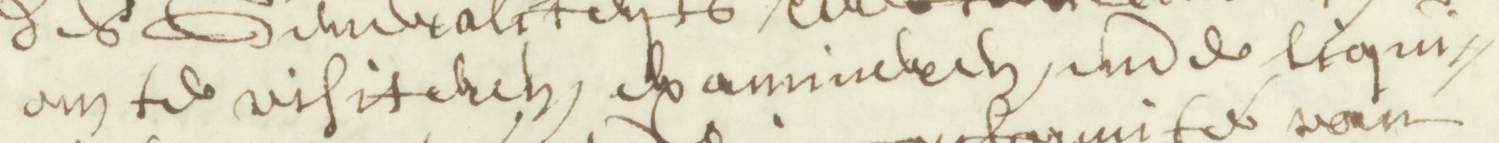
om te visiteren, examineren, ende liqui„
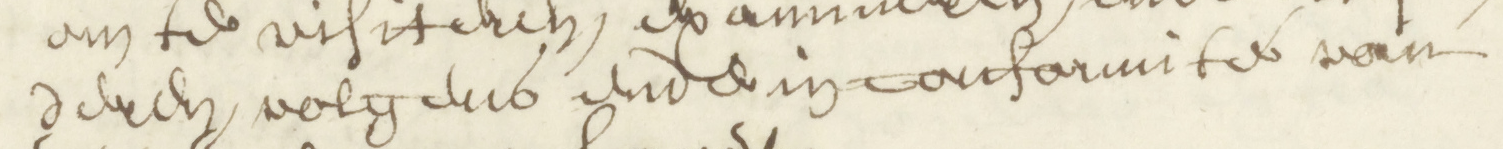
deren, volgens ende in conformité van
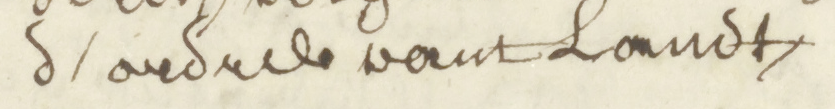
d'ordre vant Landt.
